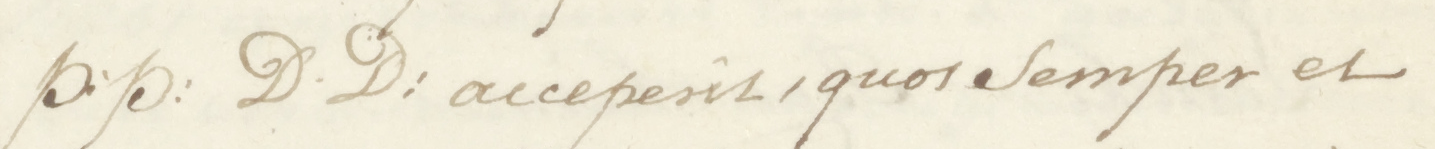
P:P: D.D: acceperit, quot semper et
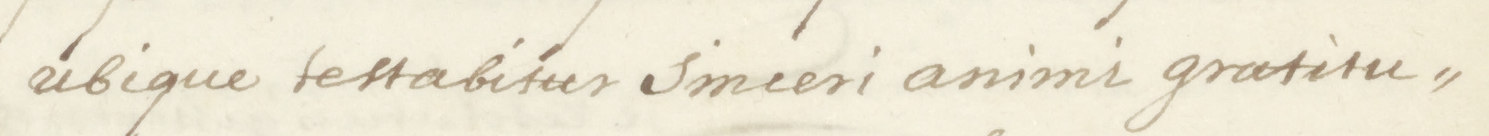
ubique testabitur Sineeri animi gratitu„
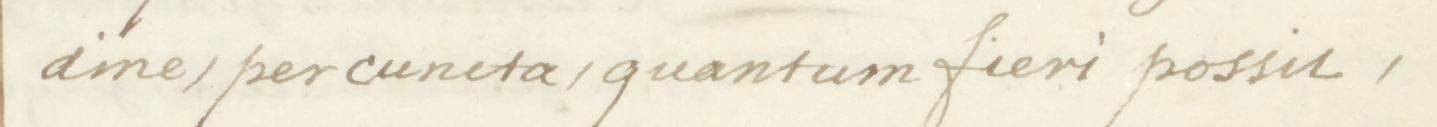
dine, per cuncta, quantum fieri possit,
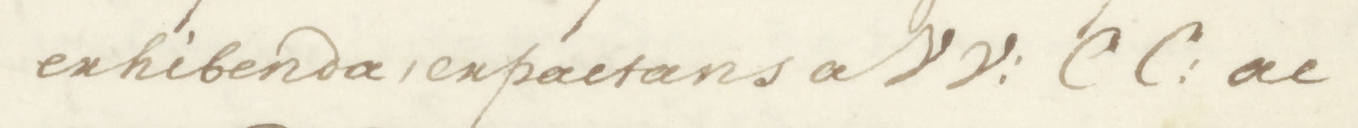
exhibenda, expactans a VV: CC: ac
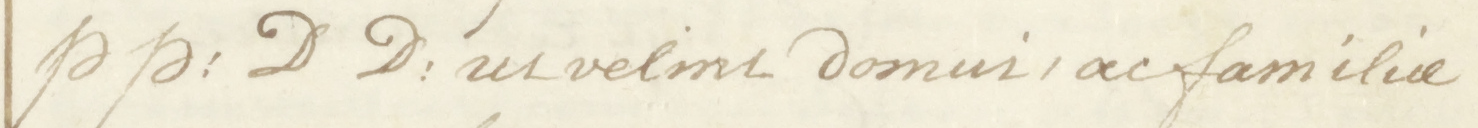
PP: DD: ut velint domui, ac familiæ
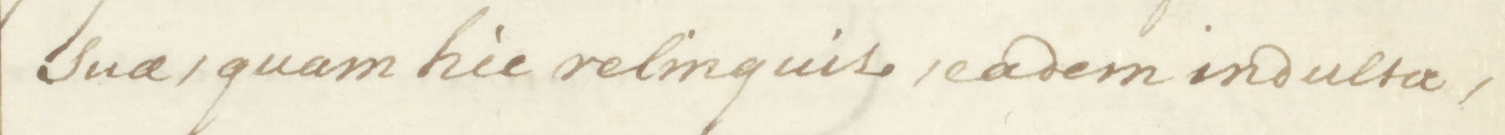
suæ, quam hic relinquit, cadem indulta,
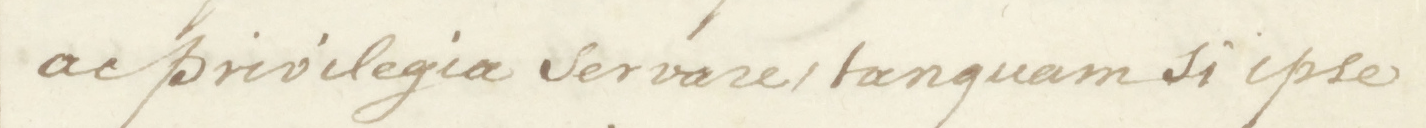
ac privilegia servare, tanquam si ipse
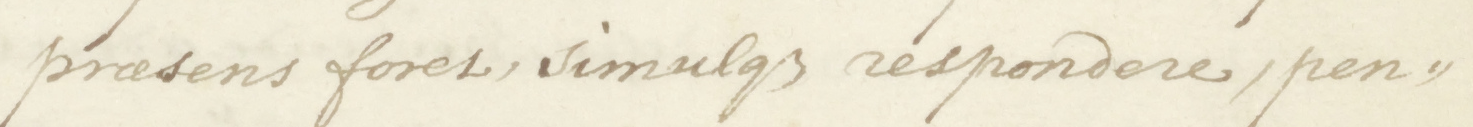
præsens foret, simulq respondere, pen„
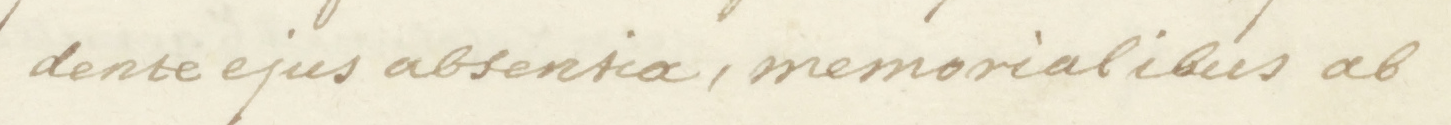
dente ejus absentia, memorialibus ab
